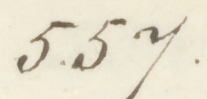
557.
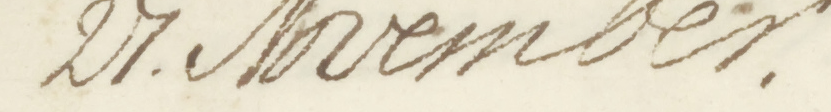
27. November.
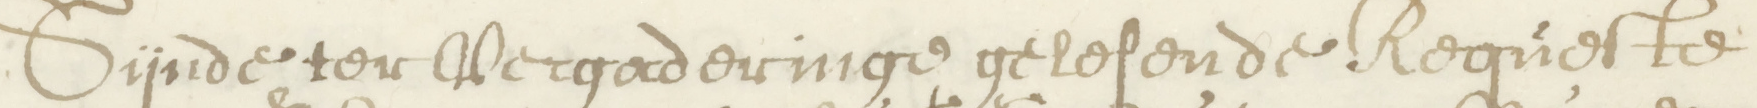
Sijnde ter Vergaderinge gelesen de Requeste
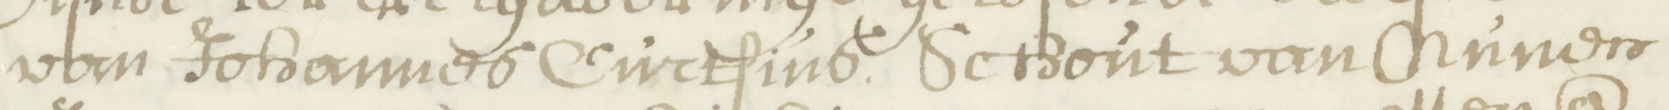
van Johannes Curtsius, Schout van Nunen
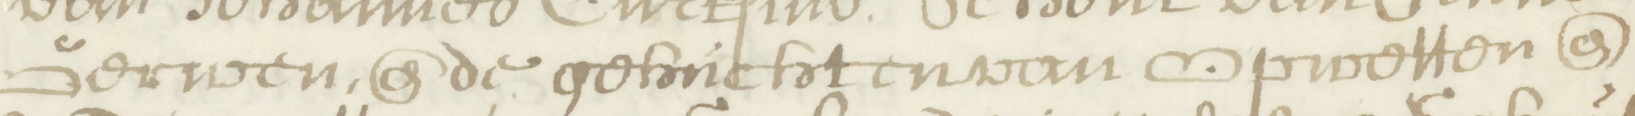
Gerwen, & de gehucht envan Opwetten &
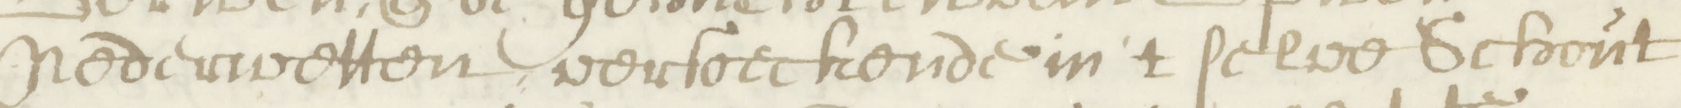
Nederwetten, versoeckende in 't selve Schout
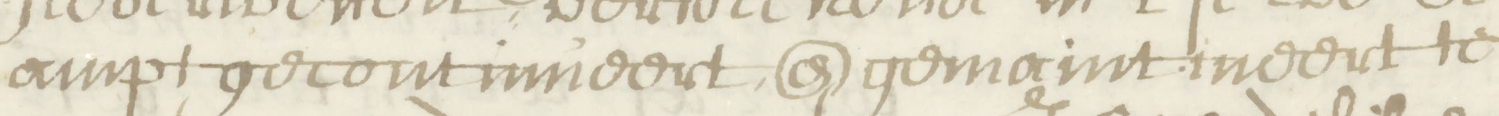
ampt gecontinueert, & gemaintineert te
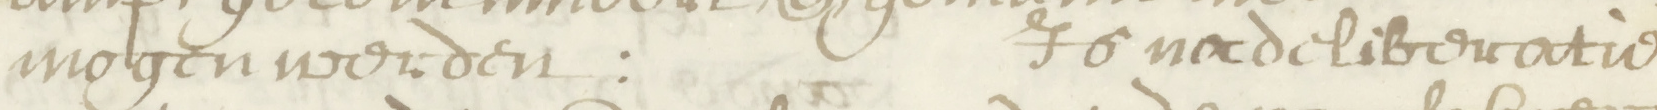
mogen werden: Is na deliberatie
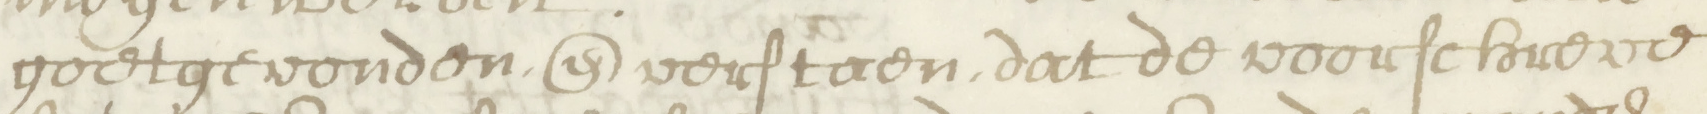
goetgevonden, & verstaen, dat de voorschreve
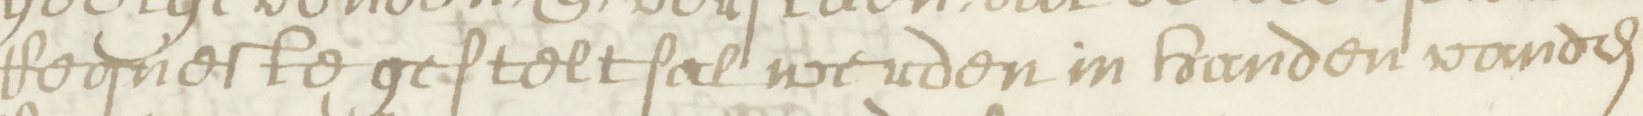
Requeste gestelt sal werden in handen vanden
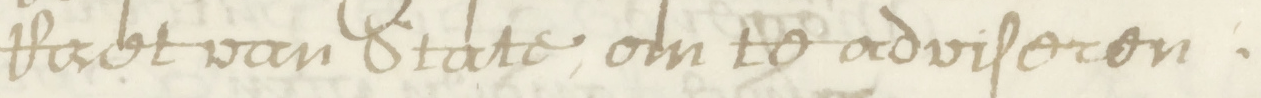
Raet van State om te adviseren.
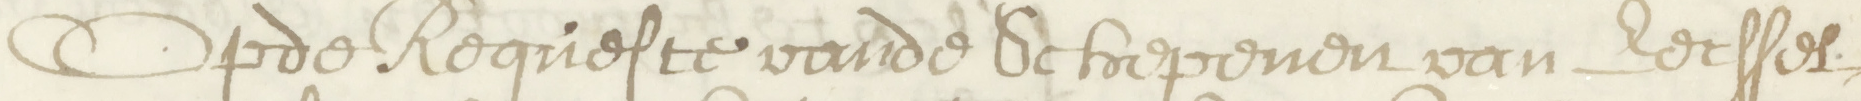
Opde Requeste vande Schepenen van Eersel
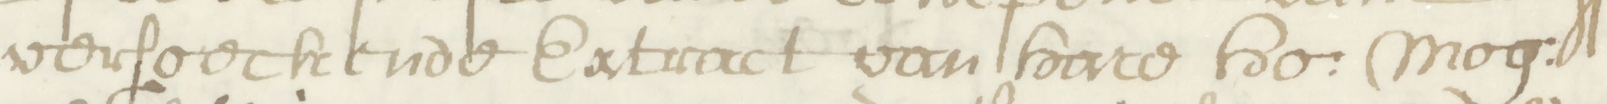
versoeckende Extract van hare ho:Mog:
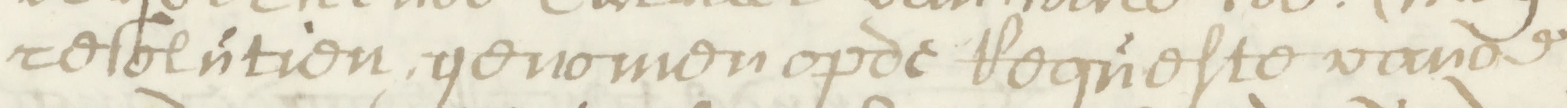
resolutien, genomen opde Requeste vande
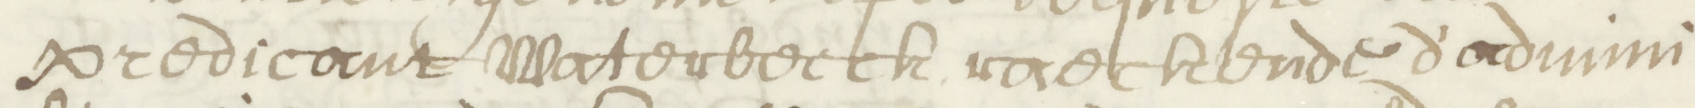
predicant Waterbeeck raeckende d‛admini
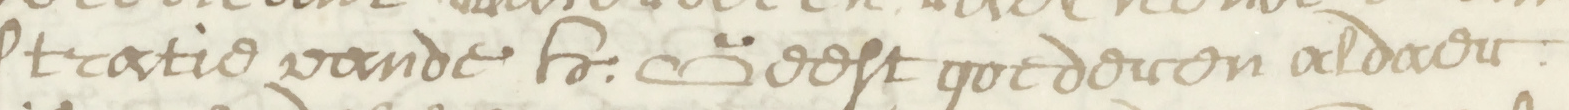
tratie vande H. Geest goederen aldaer:
